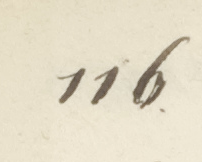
116.
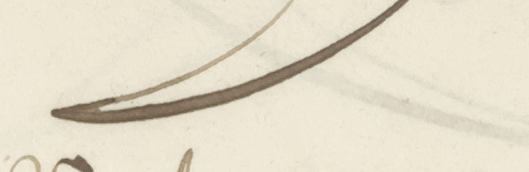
V
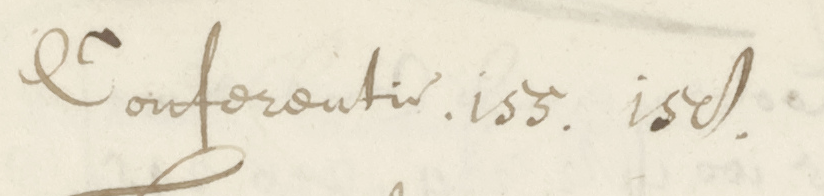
Conferentie, 155, 158.
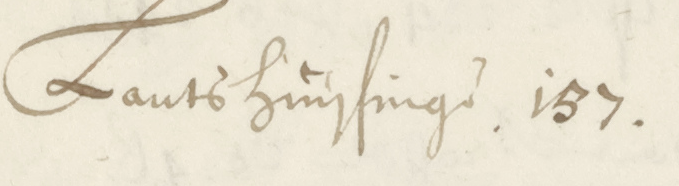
Lantshuijsinge, 157.
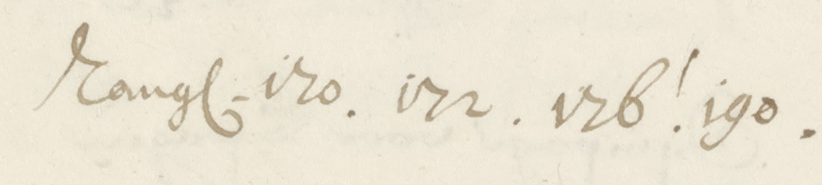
rangh, 170, 172, 176, 190.
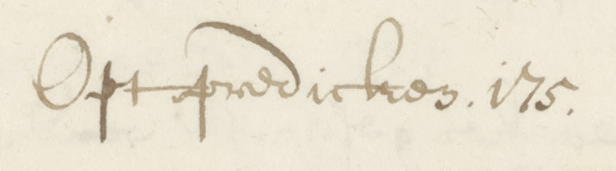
Opt predicken, 175.
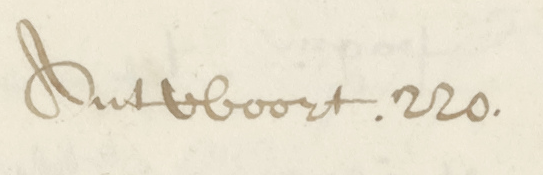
Antwoort, 220.
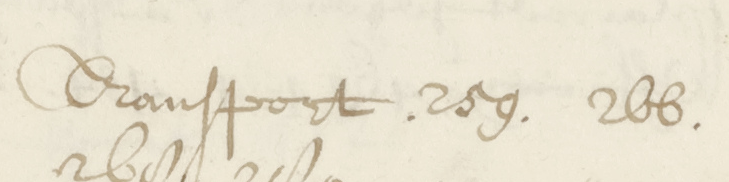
Transport, 259, 266.
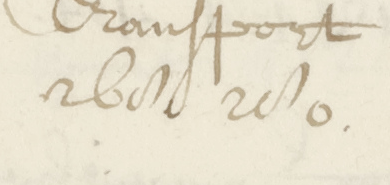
268 280.
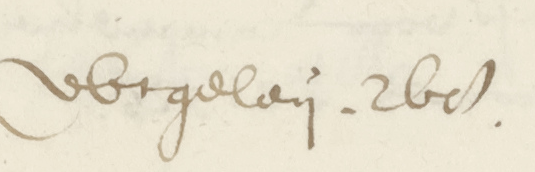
Wtgeleij, 268.
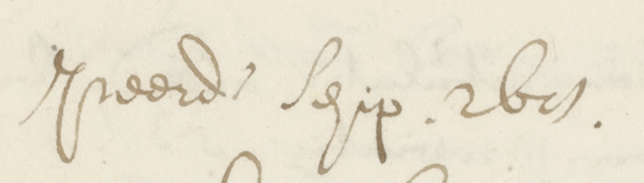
Peerde Schip, 268.
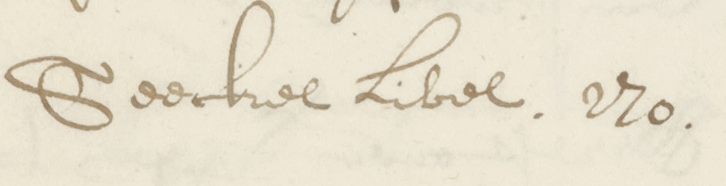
Seeckel Libel, 270.
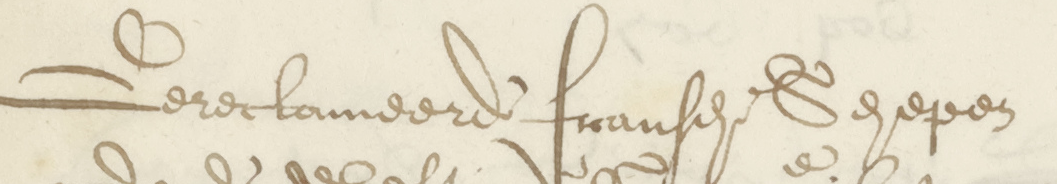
Gereclameerde Fransche Schepen
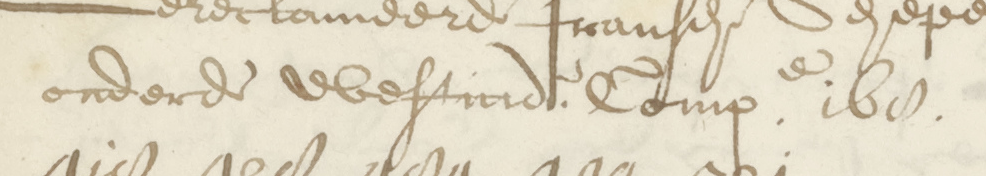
onderde Westinde Compe. 168.
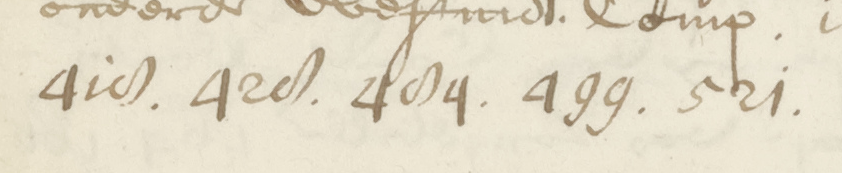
418, 428, 484, 499, 521.
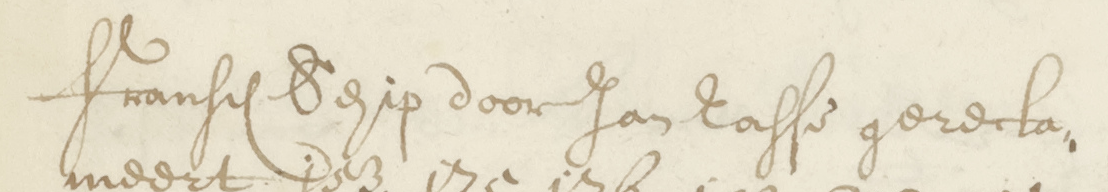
Fransch Schip door Jan rasse gerecla„
